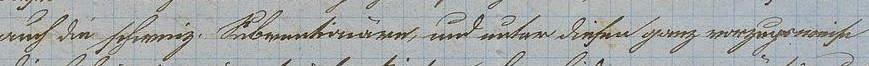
auch die schweiz. Subventionäre, und unter diesen ganz vorzugsweise
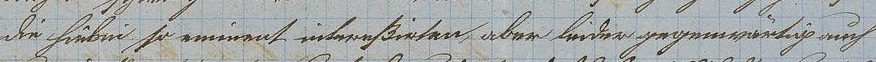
die hiebei so eminent intereßirten, aber leider gegenwärtig auch
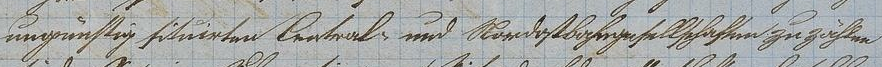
ungünstig situirten Central- und Nordostbahngesellschaften zu zählen
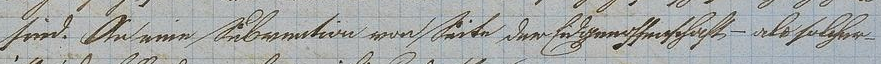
sind. An eine Subvention von Seite der Eidgenossenschaft – als solcher –
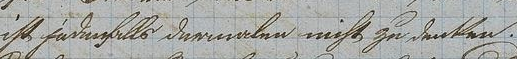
ist jedenfalls dermalen nicht zu denken.
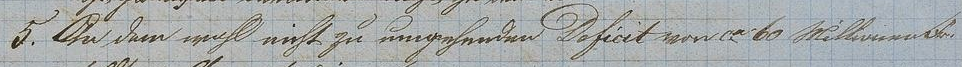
5. An dem wohl nicht zu umgehenden Deficit von ca 60 Millionen Fr.
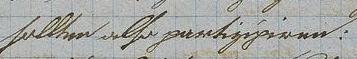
sollten also partizipiren:
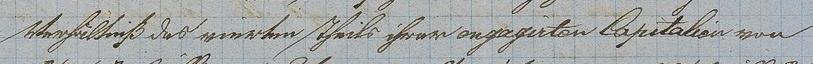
Verhältniß des vierten Theils ihrer engagirten Capitalien von
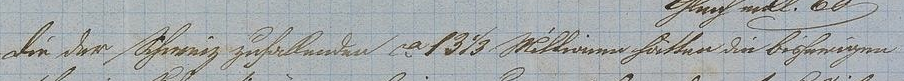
Die der Schweiz zufallenden ca 13⅓ Millionen hätten die bisherigen
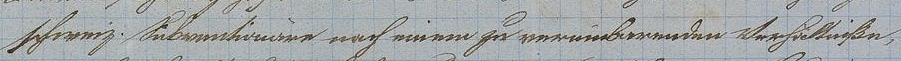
schweiz. Subventionäre nach einem zu vereinbarenden Verhältniße,
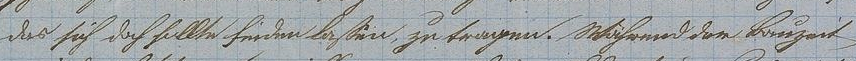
das sich doch sollte finden laßen, zu tragen. Während der Bauzeit
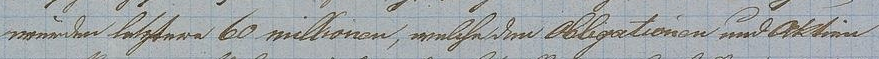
würden letztere 60 millionen, welche den Obligationen und Aktien
